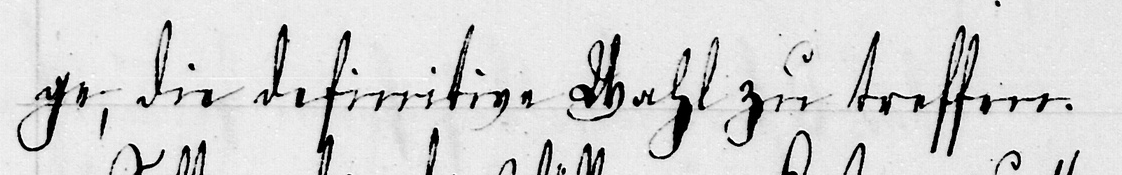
ge, die definitive Wahl zu treffen.
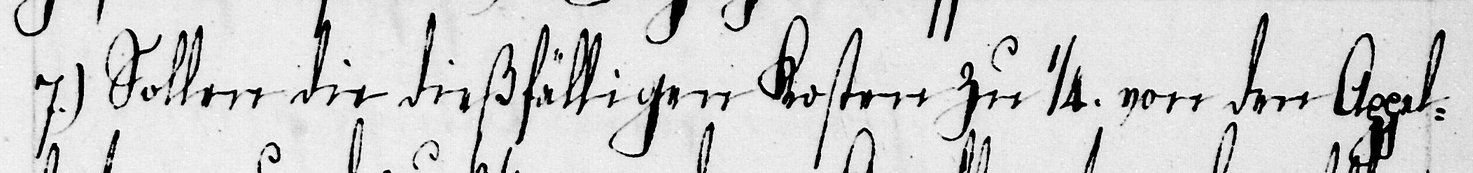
7.) Sollen die dießfälligen Kosten zu 1/4. von den Appel¬
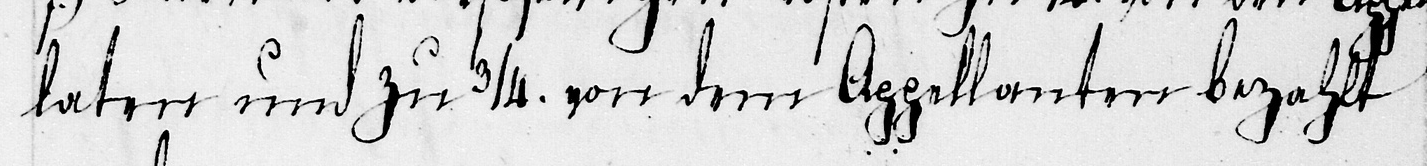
laten und zu 3/4. von dem Appellanten bezahlt
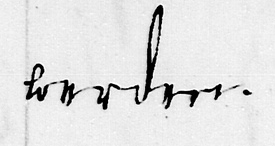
werden.
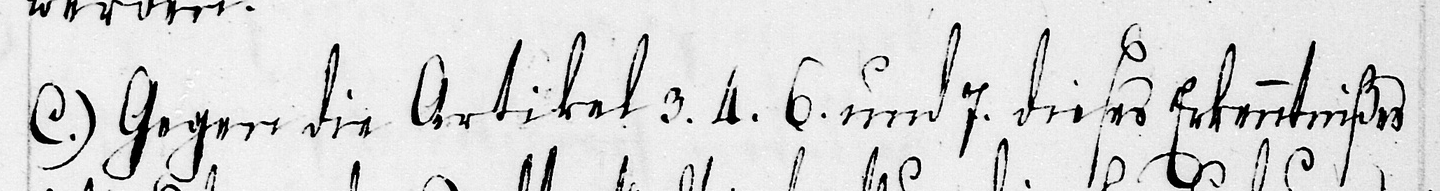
C.) Gegen die Artikel 3. 4. 6. und 7. dieses Erkenntnißes
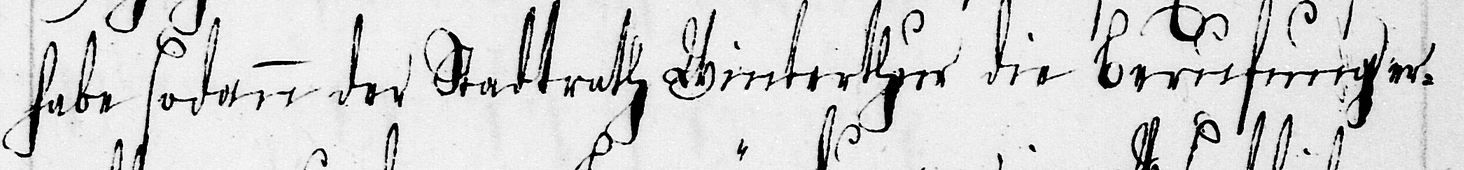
habe sodann der Stadtrath Winterthur die Berufung er¬
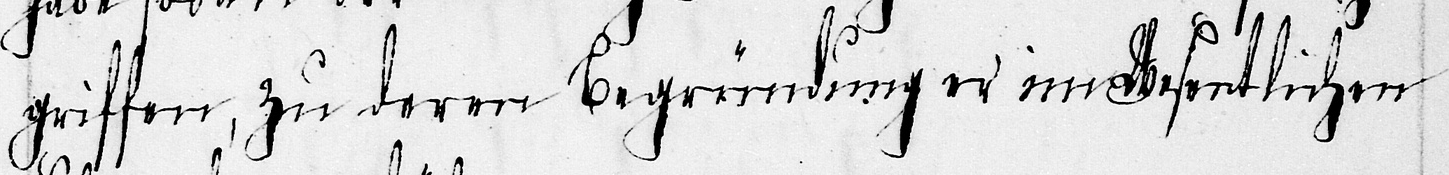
griffen, zu deren Begründung er im Wesentlichen
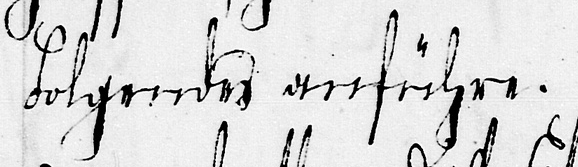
Folgendes anführe.
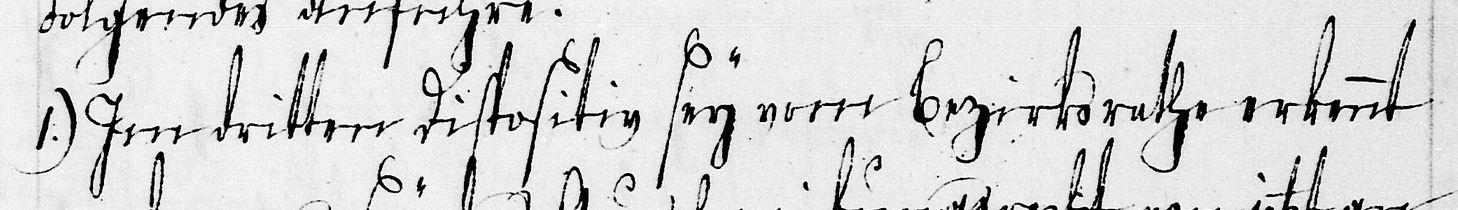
1.) Im dritten Dispositiv sey vom Bezirksrathe erkennt
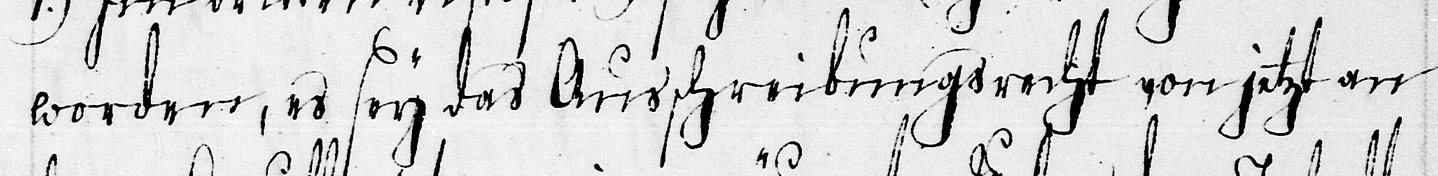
worden, es sey das Ausschreibungsrecht von jetzt an
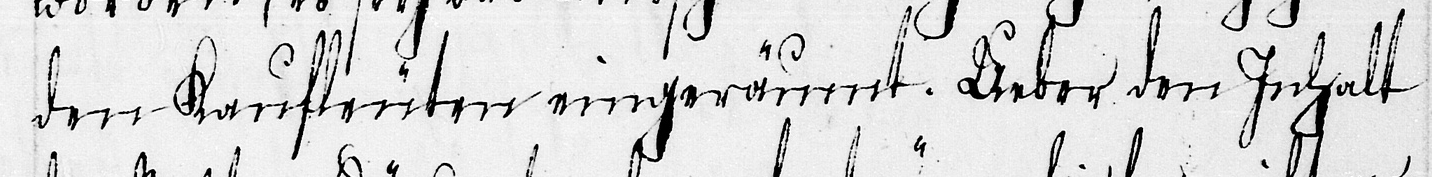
den Kaufleuten eingeräumt. Ueber den Inhalt
